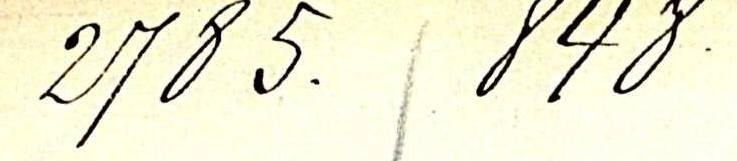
2785 [1]848
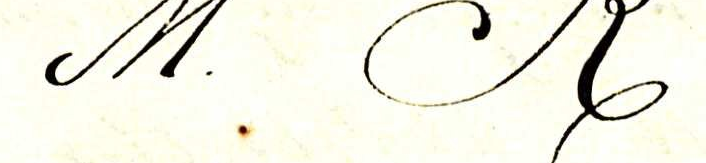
MR
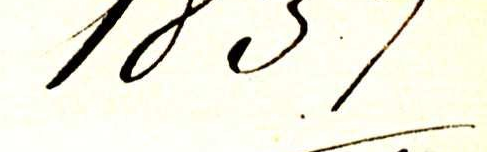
1837
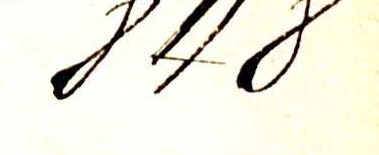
848
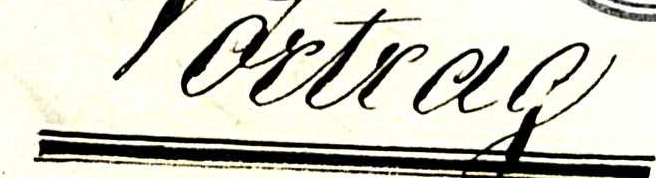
Vortrag
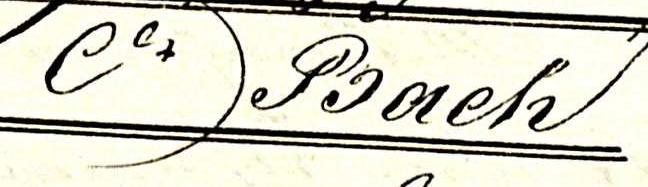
Dr Bach
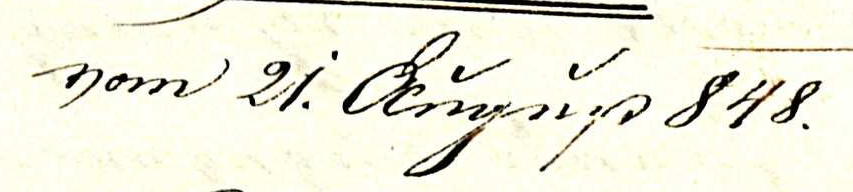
vom 21. August [1]848
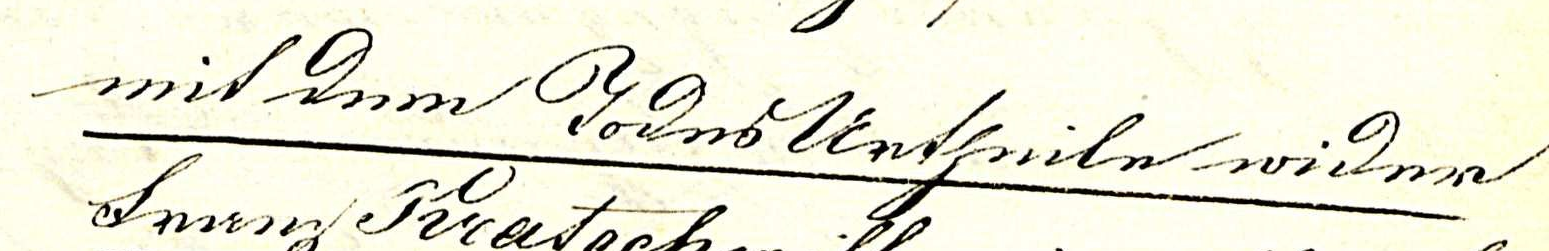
mit dem Todes Urtheile wider
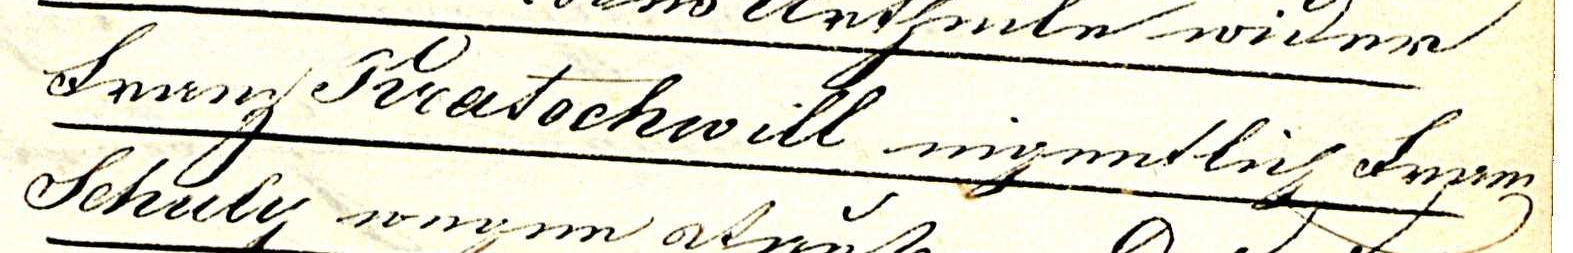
Franz Kratochwill eigentlich Franz
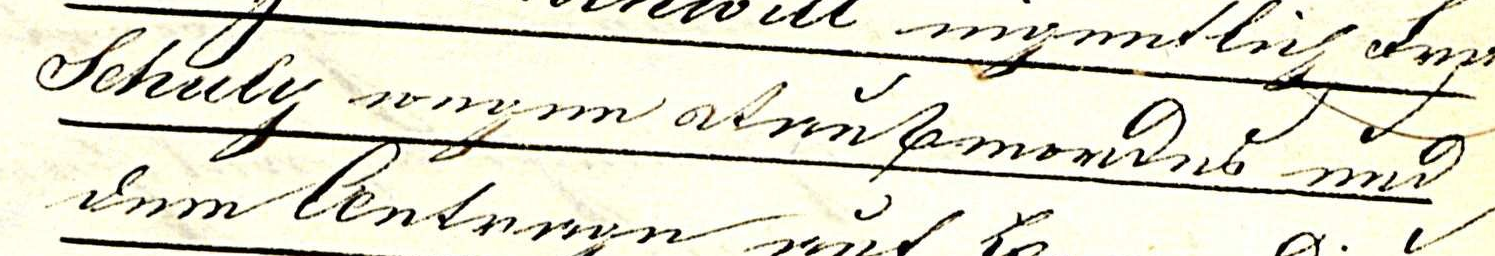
Schulz wegen Raubmordes und
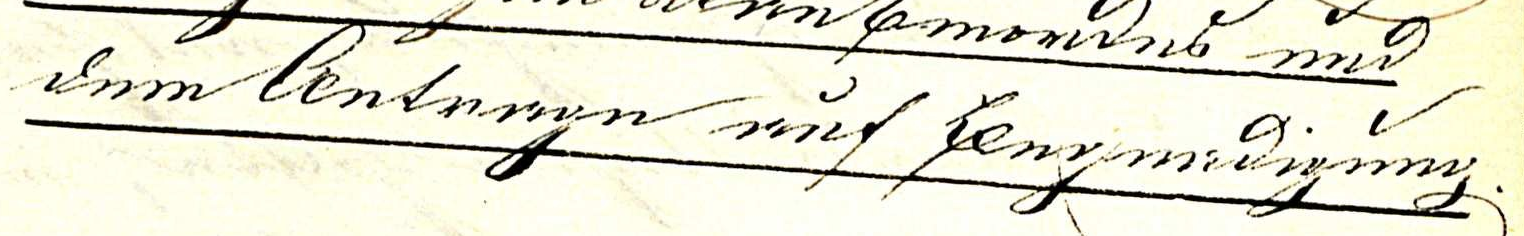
dem Antrage auf Begnadigung
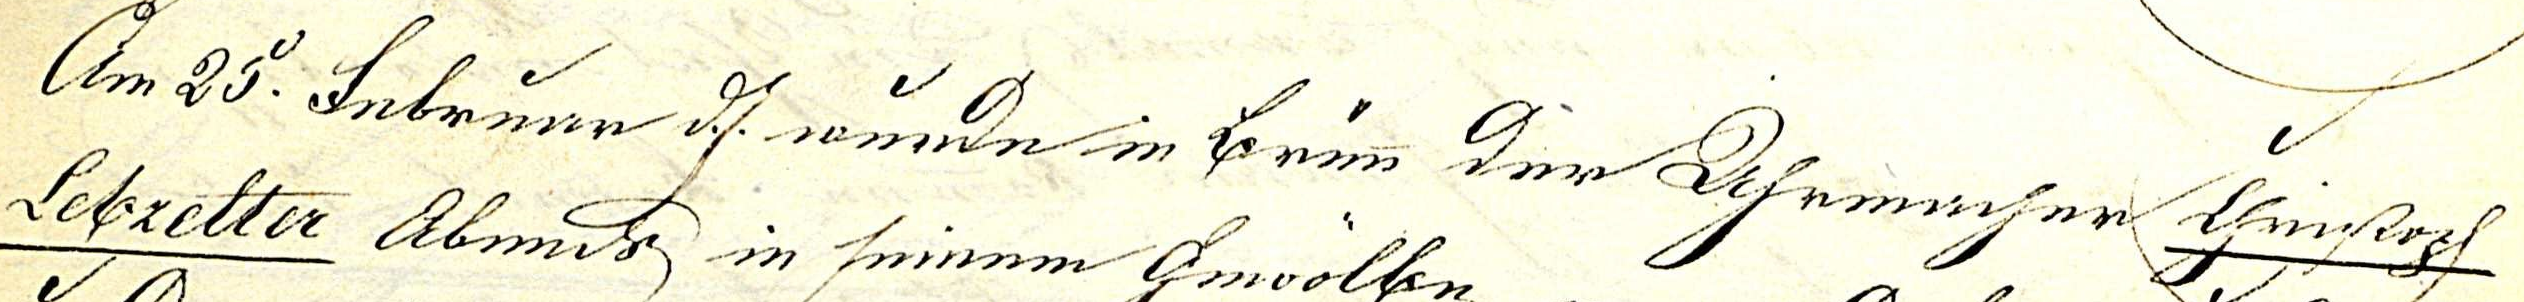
Am 25. Februar d.J. wurde in Brünn der Uhrmacher Christoph
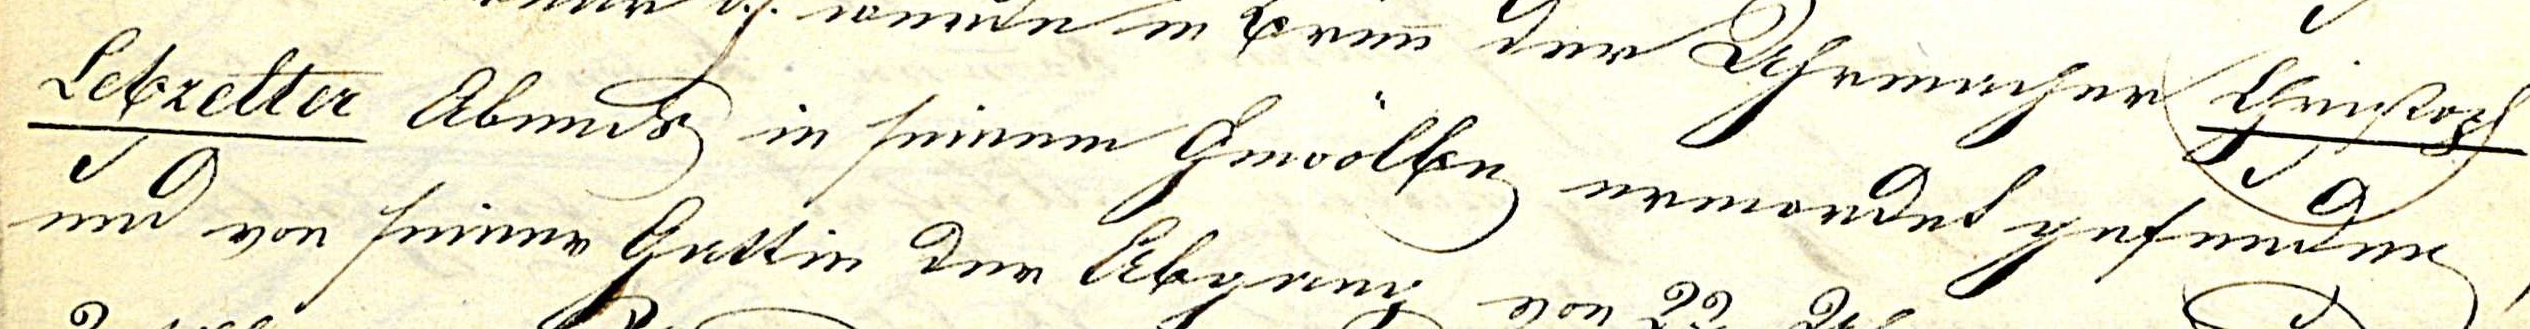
Lebzelter Abends in seinem Gewölbe ermordet gefunden
